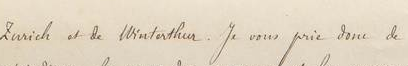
Zurich et de Winterthur. Je vous prie donc de
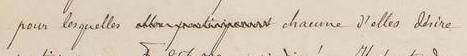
pour lesquelles elles participeront chacune d'elles désire
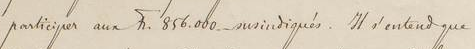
participer aux Fr. 856.000.– susindiqués. Il s'entend que
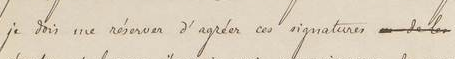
je dois me réserver d'agréer ces signatures ... de les
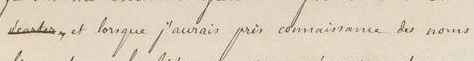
écartes, et lorsque j'aurais pris connaissance des noms
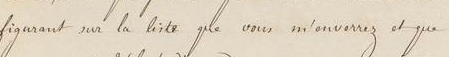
figurant sur la liste que vous m'enverrez et que
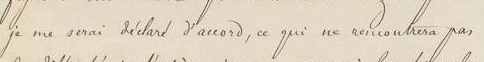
je me serai déclaré d'accord, ce qui ne rencontrera pas
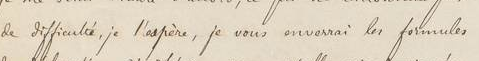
de difficulté, j l'espère, je vous enverrai les formules
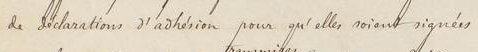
de déclarations d'adhésion pour qu'elles soient signées
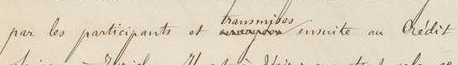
par les participants et envoyéestransmises ensuite au Crédit
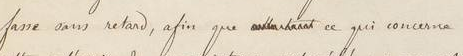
fasse sans retard, afin que ... tout ce qui concerne
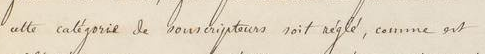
cette catégorie de souscripteurs soit réglé, comme est
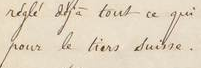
pour le tiers Suisse.
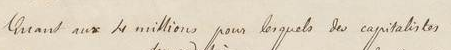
Quant aux 4 millions pour lesquels des capitalistes
